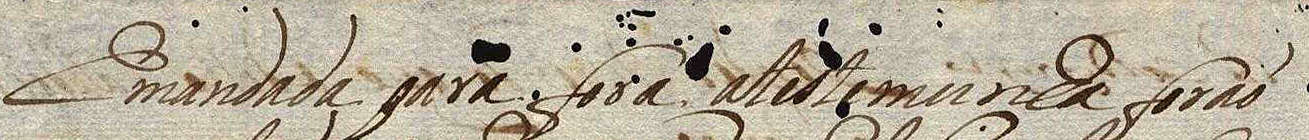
E mandada para fora a testemunha foraõ
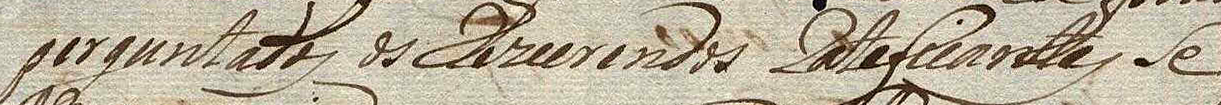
perguntados os Reverendos Rateficantes se
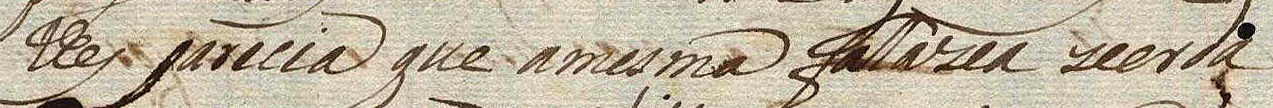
lhes parecia que a mesma falava verda
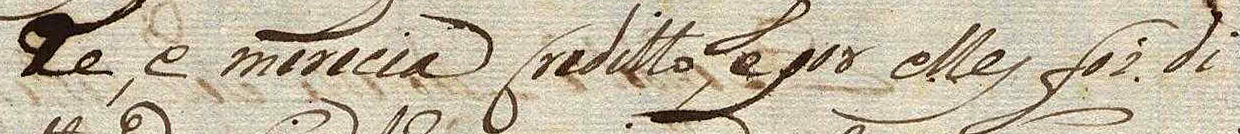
de, e merecia Creditto, e por elles foi di
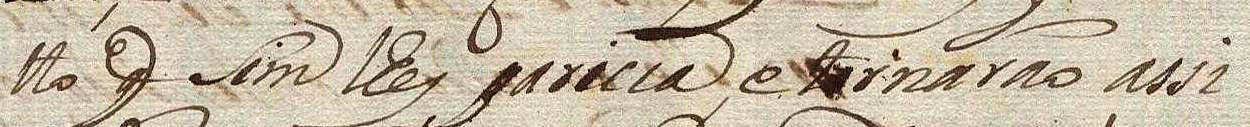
tto q̄ sim lhes parecia, e tornaraõ assi
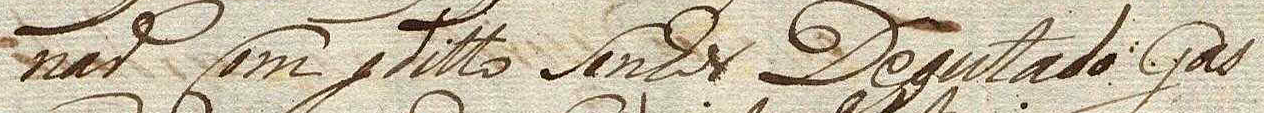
nar Com o ditto Senhor Deputado Gas
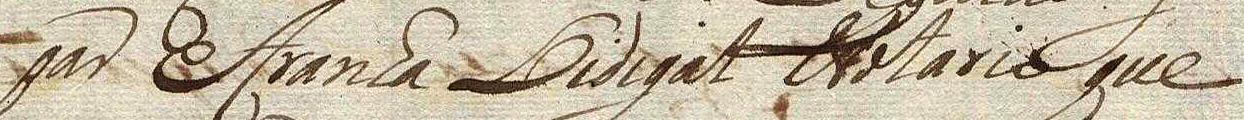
par Aranha Vidigal Notario que
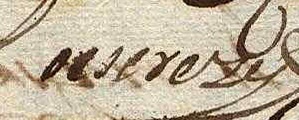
o escrevj
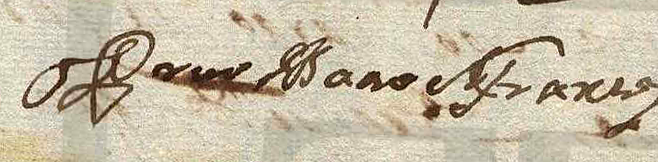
O Pror Manoel Franco
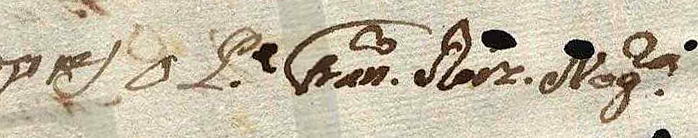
O P.e Franco. Roiz̄ Nog.ra
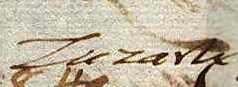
Zuzarte
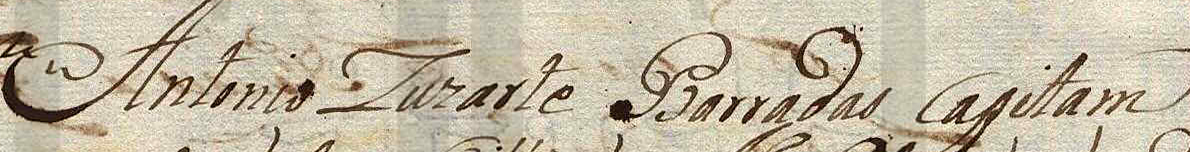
Antonio Zuzarte Barradas capitam
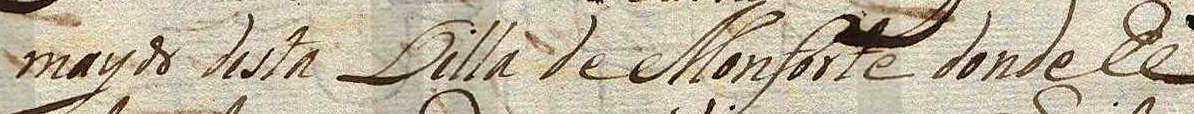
mayor desta Villa de Monforte donde he
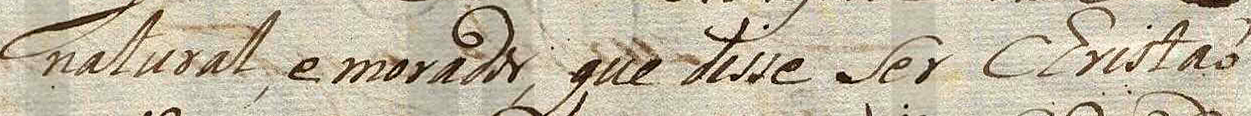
natural, e morador que disse ser Christaõ
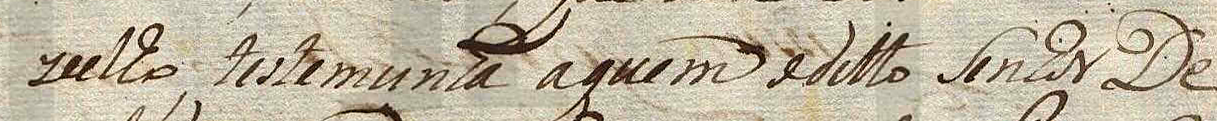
uelho, testemunha a quem o ditto Senhor De
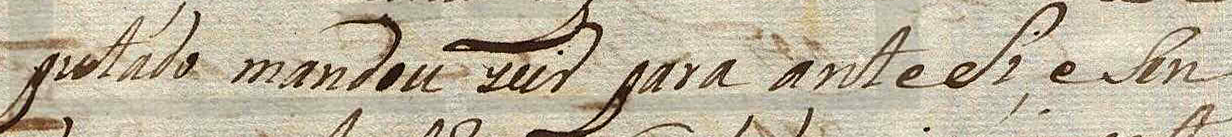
putado mandou vir para ante Si, e sen
